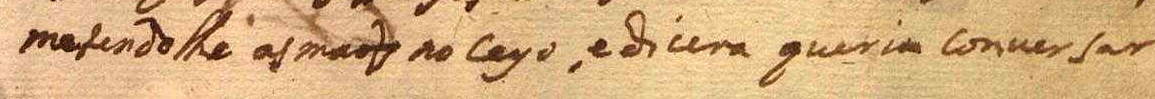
metendolhe as maõs no ceyo, e dicera queria conuersar
